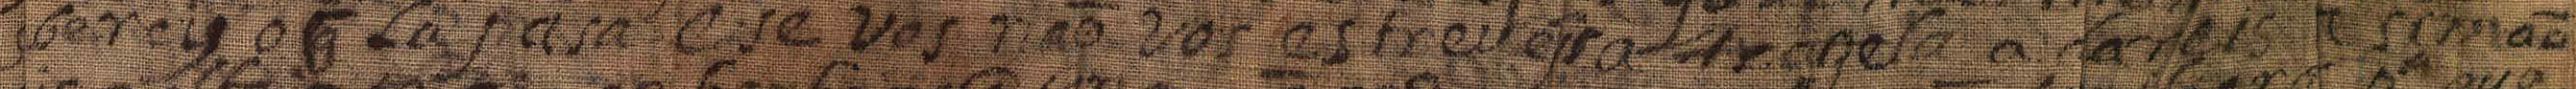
sbereis o q̄ la pasa e se vos naõ vos estreuejs a trazela a dareis a simaõ
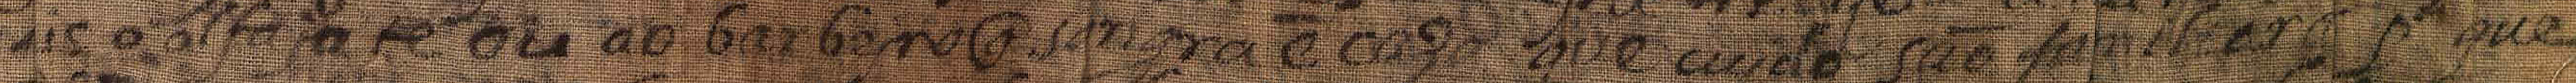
is o alfajate ou ao barbejro q̄ sangra ē caza que cujdo saõ familiares pa que
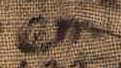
em
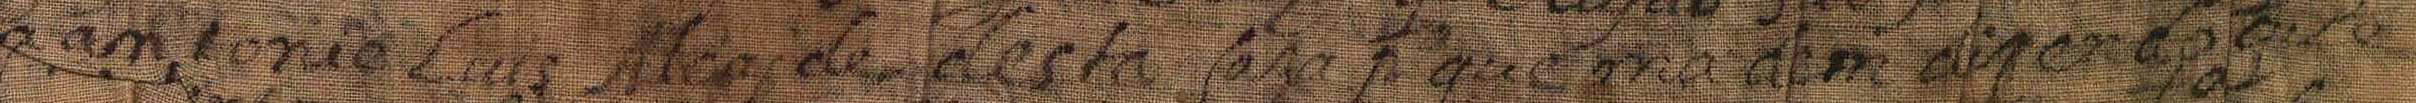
a antonio Luis Alcajde desta Caza ꝑ que ma dem dizendo que
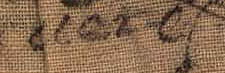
uerej
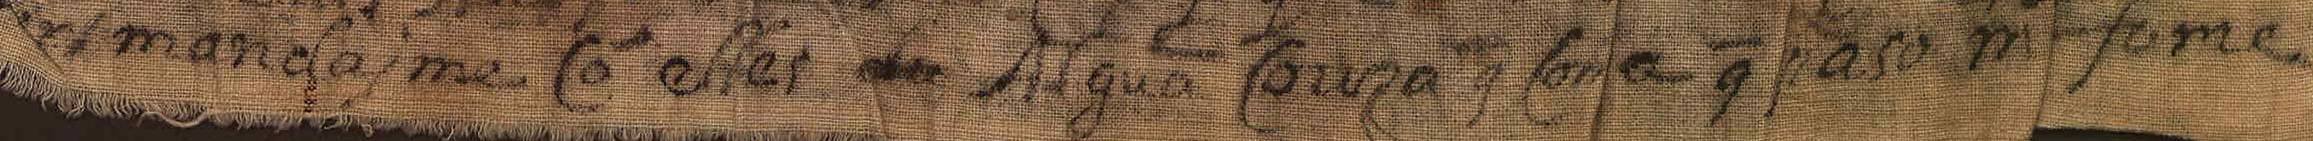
r / mandajme Cō elles alu Alguā Couza q̄ Coma q̄ paso mta fome
